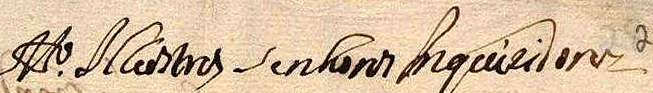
M.o Illustres Senhores Inquizidores
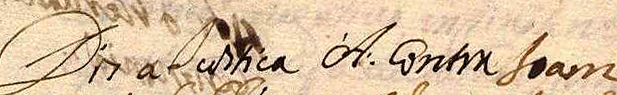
Dis a Iustiça A. Contra Joam
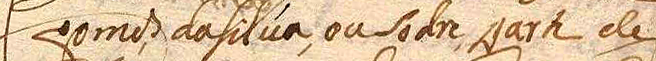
gomes da Silua, ou Sodre, parte de
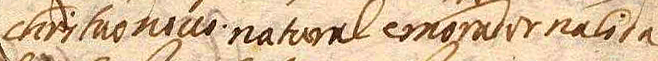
christao nouo. natural e morador na Cida
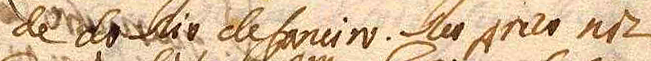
de do Rio de Janeiro. Reo prezo nos
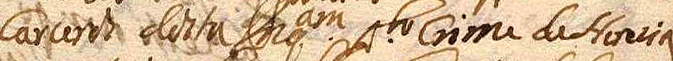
Carceres desta Inq.am p.lo Crime de Herezia
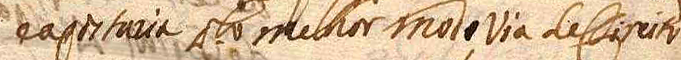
e apostazia p.lo melhor modo, Via de Direito
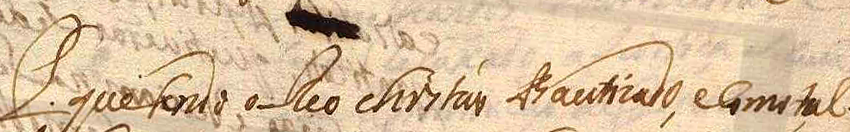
P. que tendo o Reo christão Bautizado, e Como tal.
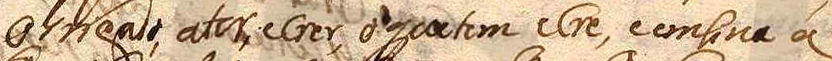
obrigado, a ter, e crer, o que tem e Cre, e emsina á
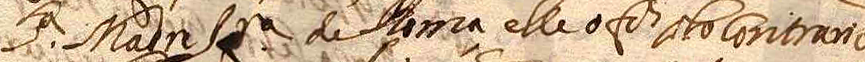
S.ta Madre Ig.ra de Roma, elle o fes p.lo Contrario
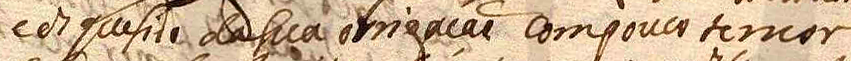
e esquesido da sua obrigaçaõ com pouco temor
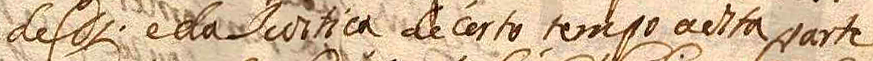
de Ds. e da Iustiça de certo tempo a esta parte
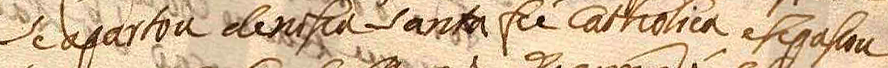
se apartou de nossa santa feé catholica, e se passou
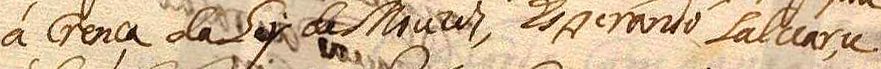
á crença da Ley de Mouzes, Esperando saluarçe
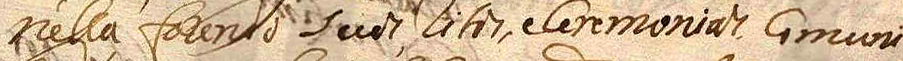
nella fazendo seus, Ritos, e Ceremonias. Comuni
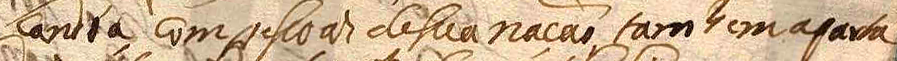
candoa, com pessoas de sua nação, tambem aparta
